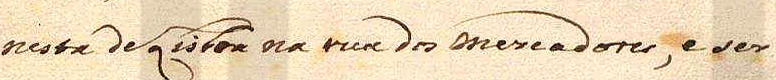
nesta de Lisboa na rua dos mercadores, e ser
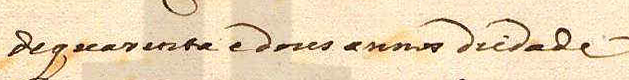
de quarenta e dous annos de idade
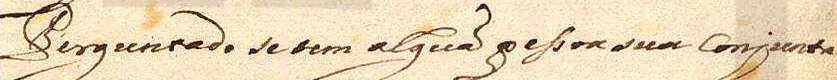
Perguntado se tem alguā pessoa sua conjunta
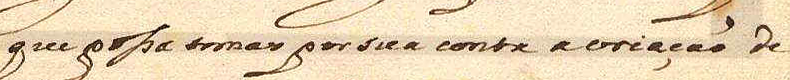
que possa tomar por sua conta a criaçaõ de
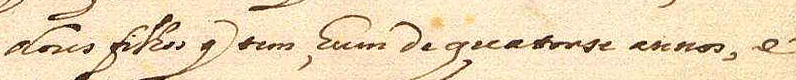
dous filhos q̄ tem, hum de quatorse annos, e
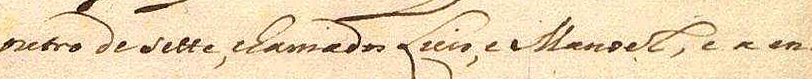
outro de sette, chamados Luis, e Manoel, e a en
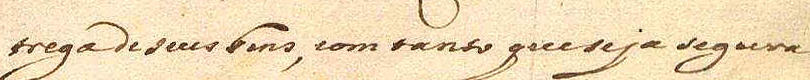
trega de seus bens, com tanto que seja segura
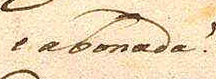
e abonada?
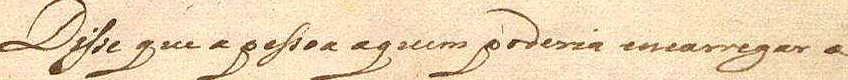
Disse que a pessoa a quem poderia encarregar a
